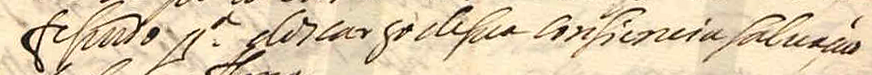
fessado p.a descargo de sua consiencia saluaçaõ
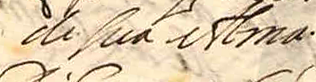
de sua Alma.
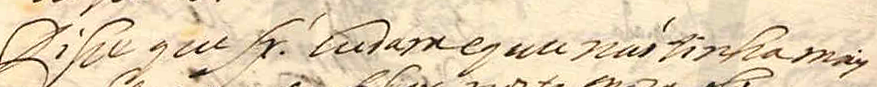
Disse que sy. cudara e que naõ tinha mais
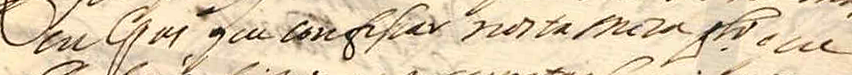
culpas que confessar nesta Meza p.lo que
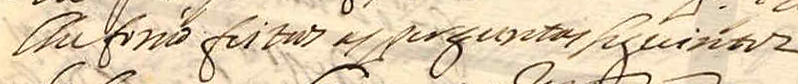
lhe foraõ feitas as perguntas seguintes
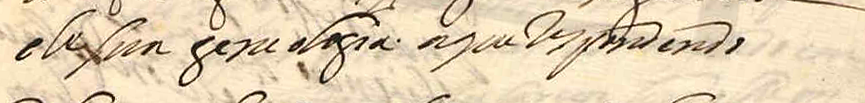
de sua genealogia. a que Respondendo
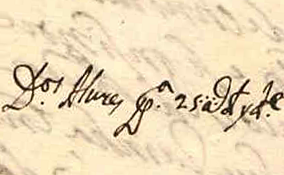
D.os Alures p.a 25 ā d̄ yd.e
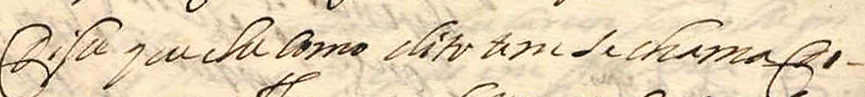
Dise que elle como dito tem se chama Do
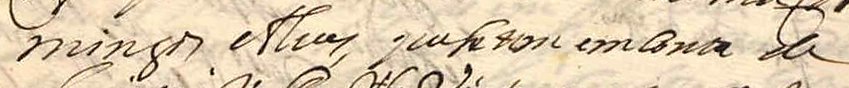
mingos Alues, que se tem em conta de
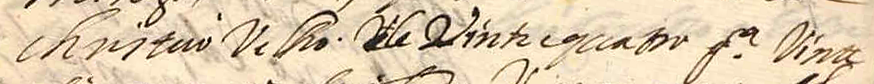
christaõ Velho. de Vinte e quatro p.a Vinte
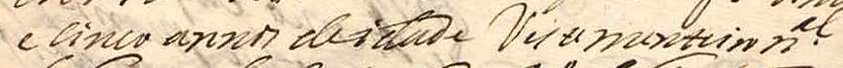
e cinco annos de idade Vistementeiro n.al
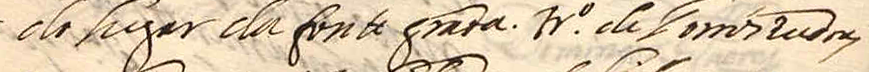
do lugar da fonte grada. tr.o de Torres vedras
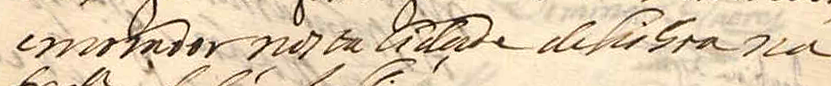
e morador nesta Cidade de lisboa na
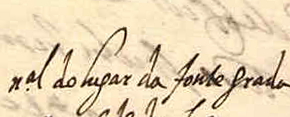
n.al do lugar da fonte grada
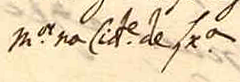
m.or na Cid̄.e de Lx.a
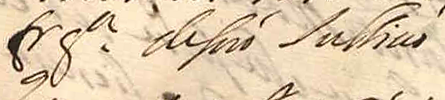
frga. de saõ Iuliaõ
